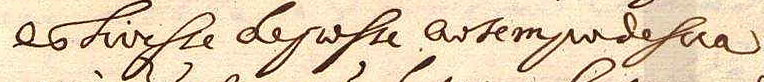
estivesse de posse ao tempo de sua
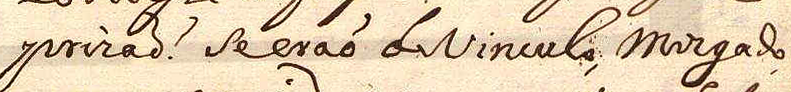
prizaõ? se eraõ de vinculo, morgado,
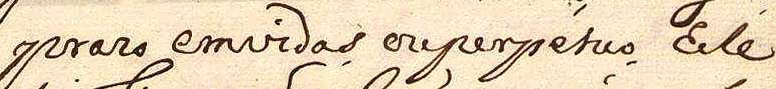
prazo em vidas, ou perpetuo, Ecle
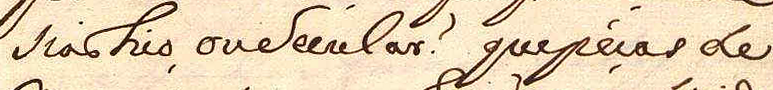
siastico, ou Secular? que péças de
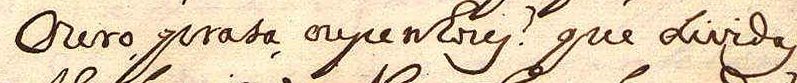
Ouro, prata, ou penhores? que dividas
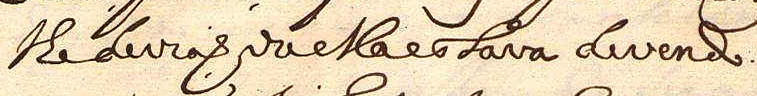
lhe deviaõ, ou ella estava devendo?
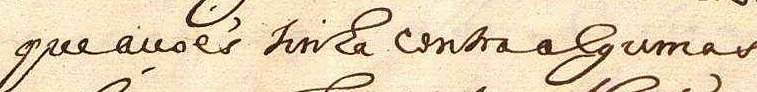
que acçoẽs tinha contra algumas
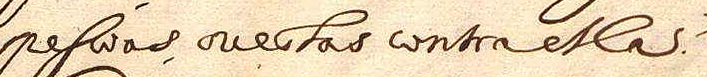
pessoas, ou estas contra ella?
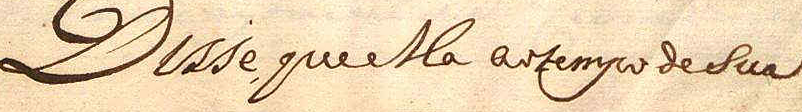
Disse, que ella ao tempo de Sua
